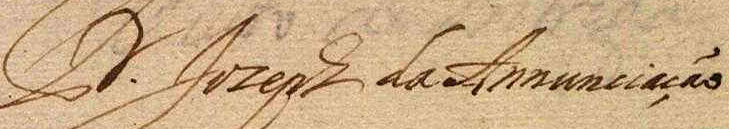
Fr. Jozeph da Annunciação
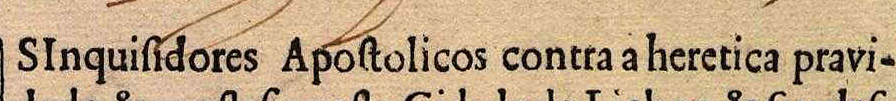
S Inquisidores Apostolicos contra a heretica pravi
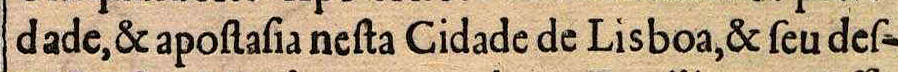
dade, & apostasia nesta Cidade de Lisboa, & seu des
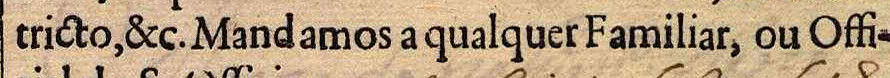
tricto, &c. Mandamos a qualquer Familiar, ou Offi
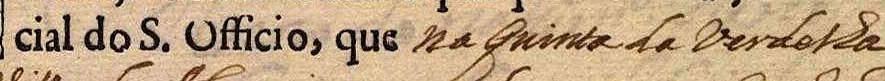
cial do S. Officio, que na Quinta da Verdelha
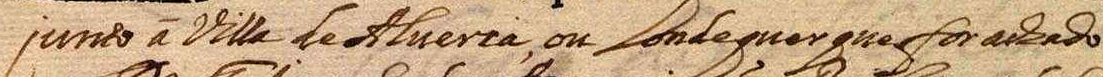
junto á Villa de Aluerca, ou onde quer que for achado
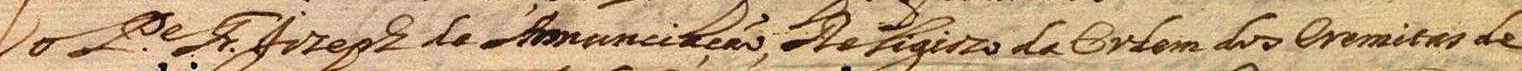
o Pe Fr. Jozeph da Annunciaçaõ, Religiozo da Ordem dos Eremitas de
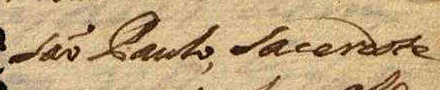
saõ Paulo, sacerdote
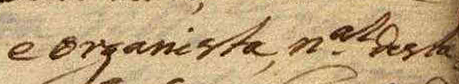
e organista, n.al desta
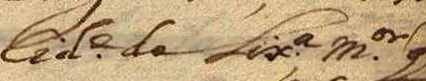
Cid.e de Lix.a m.or q̄
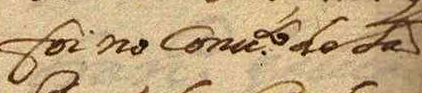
foi no Conu.to de Saõ
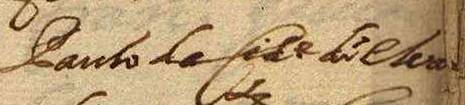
Paulo da Cid.e de Elva
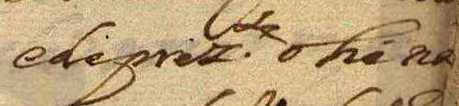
e de prez.te o hé na
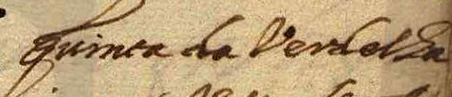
quinta da Verdelha
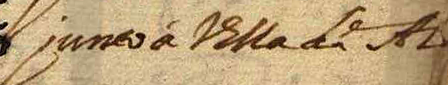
junto á Villa de Al
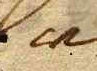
ca
